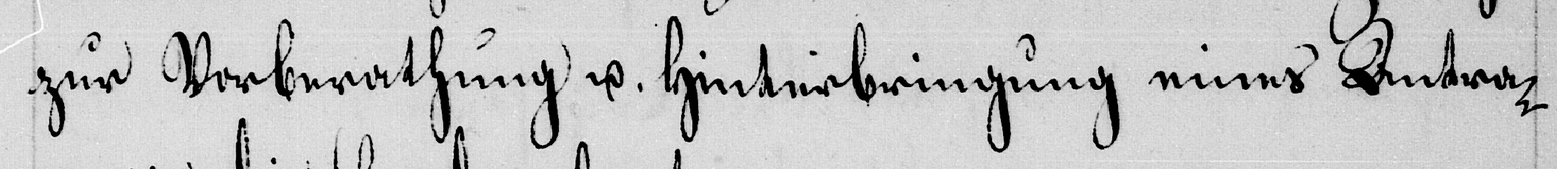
zur Vorberathung u. Hinterbringung eines Antra¬
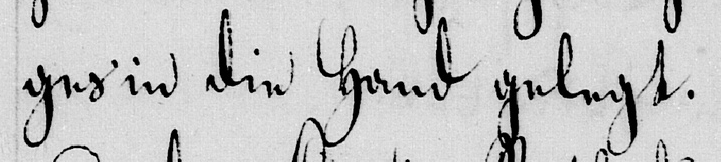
ges in die Hand gelegt.
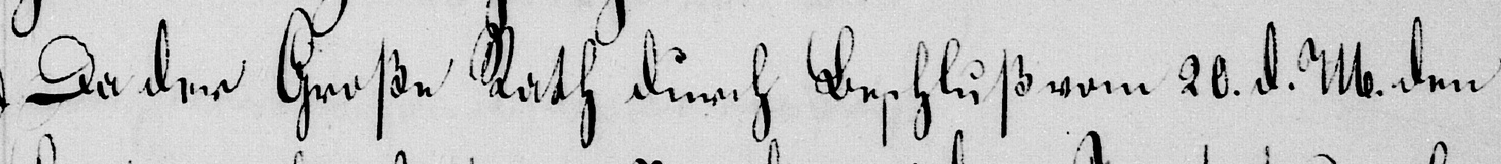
Da der Große Rath durch Beschluß vom 20. d. M. den
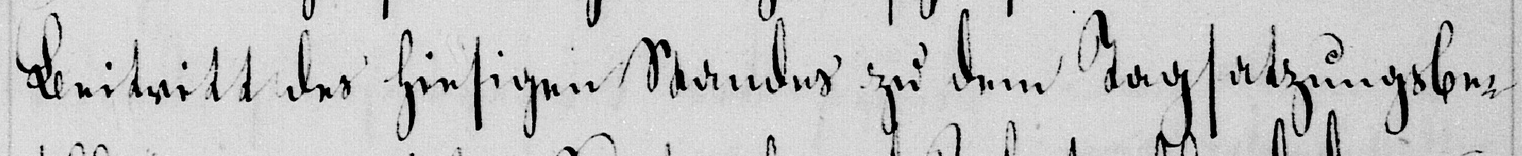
Beitritt des hiesigen Standes zu dem Tagsatzungsbe¬
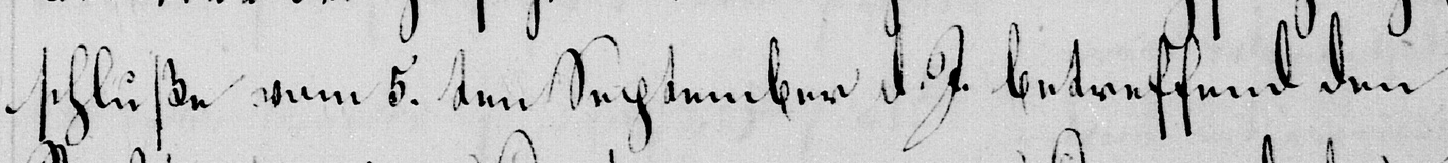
schluße vom 5.ten September d. J. betreffend den
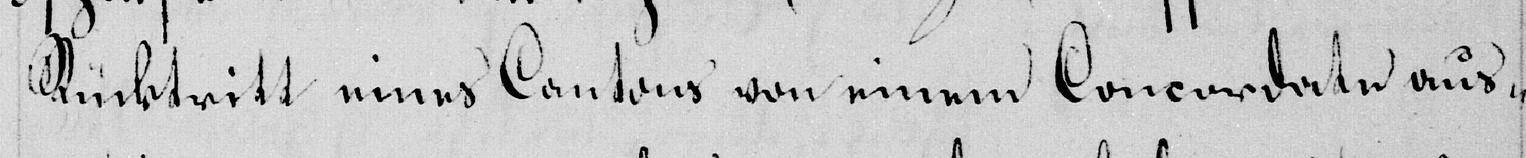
Rücktritt eines Cantons von einem Concordate aus¬
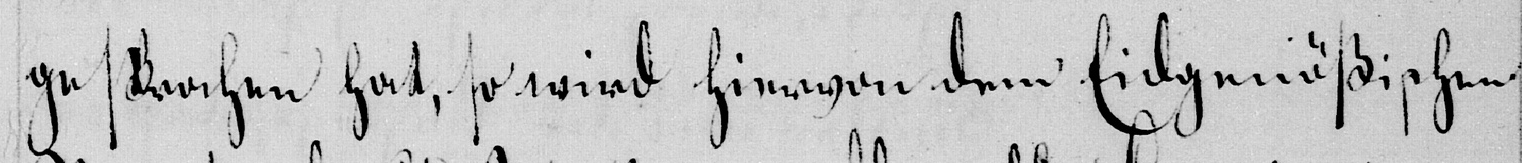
gesprochen hat, so wird hiervon dem Eidgenößischen
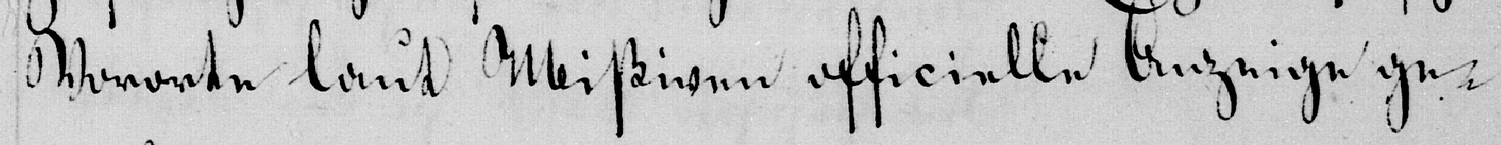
Vororte laut Mißiven officielle Anzeige ge¬
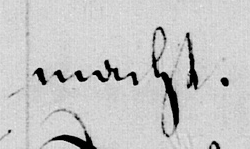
macht.
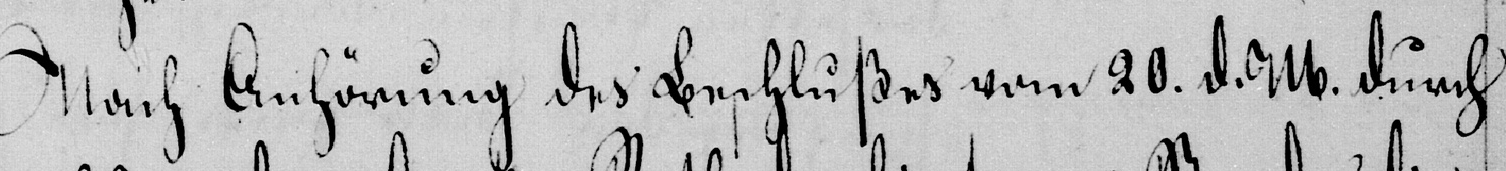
Nach Anhörung des Beschlußes vom 20. d. M. durch
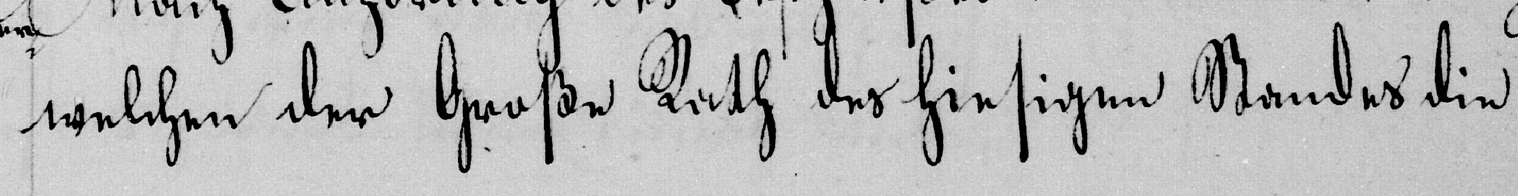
welchen der Große Rath des hiesigen Standes die
